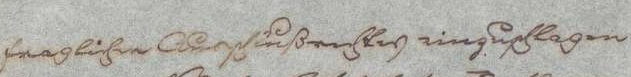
fraglichen Ausschlußrechtes einzuschlagen
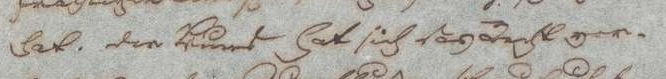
hat. Der Bund hat sich das Recht vor-
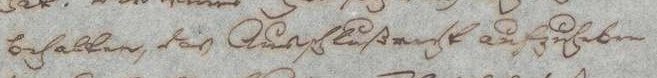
behalten, das Ausschlußrecht aufzuheben
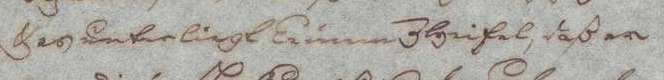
& es unterliegt keinem Zweifel, daß er
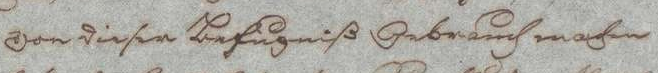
von dieser Befugniß Gebrauch machen
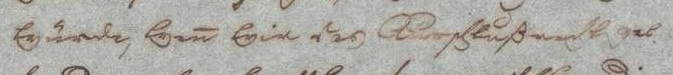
würde, wenn wir das Ausschlußrecht gel-
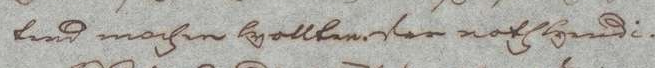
tend machen wollten. Der nothwendi-
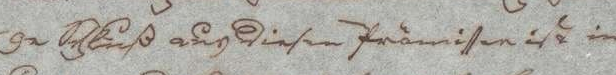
ge Schluß aus diesen Prämissen ist in
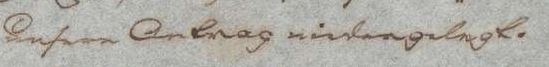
unsern Antrag niedergelegt.
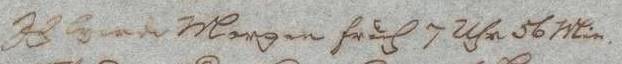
Ich werde Morgen früh 7 Uhr 56 Min.
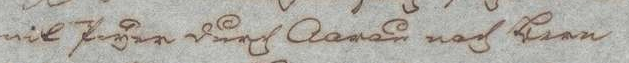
mit Peyer durch Aarau nach Bern
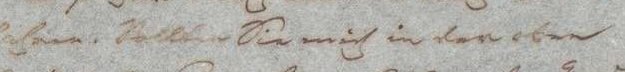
fahren. Sollten Sie mich in der eben
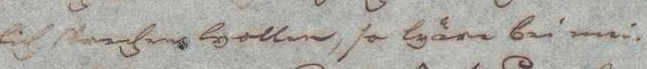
lich sprechen wollen, so wäre bei mei-
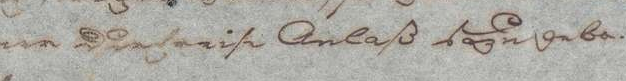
ner Durchreise Anlaß dazu gebo-
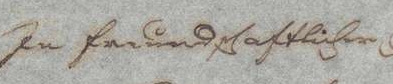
In freundschaftlicher
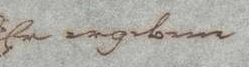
Ihr ergebene
